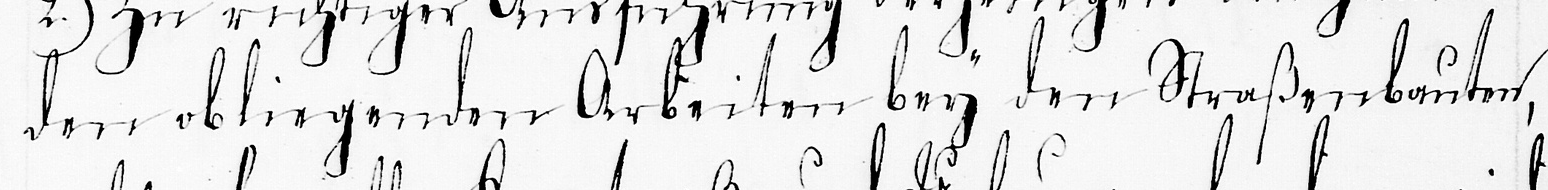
den obliegenden Arbeiten bey den Straßenbauten,
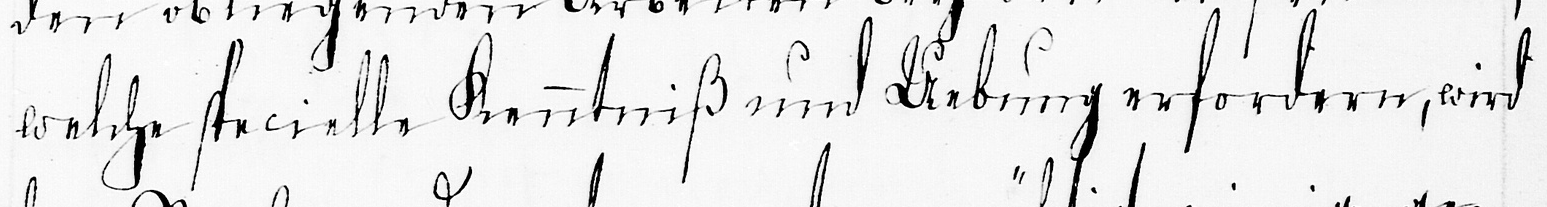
welche specielle Kenntniß und Uebung erfordern, wird
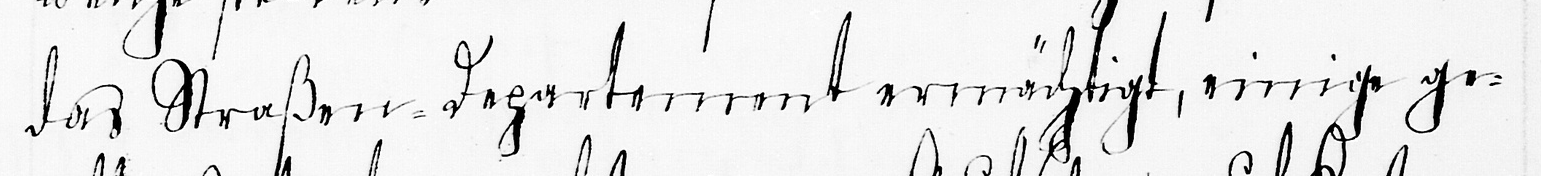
das Straßen-Departement ermächtigt, einige ge¬
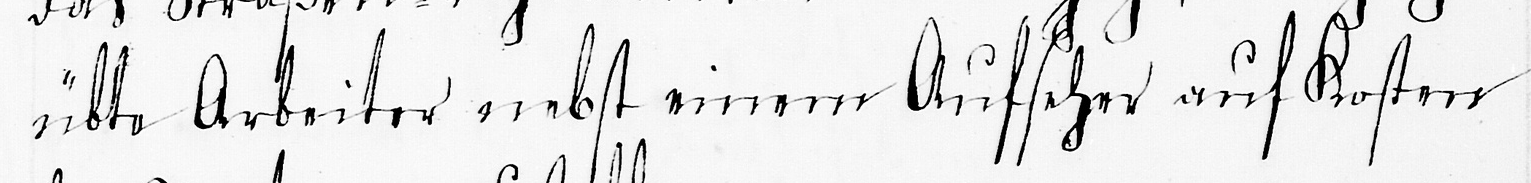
übte Arbeiter nebst einem Aufseher auf Kosten
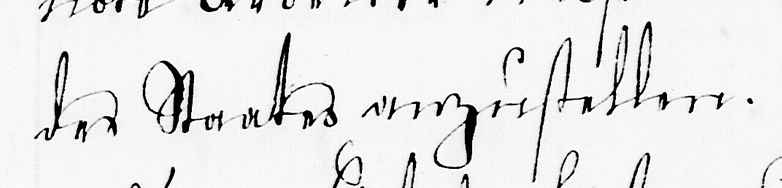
des Staates anzustellen.
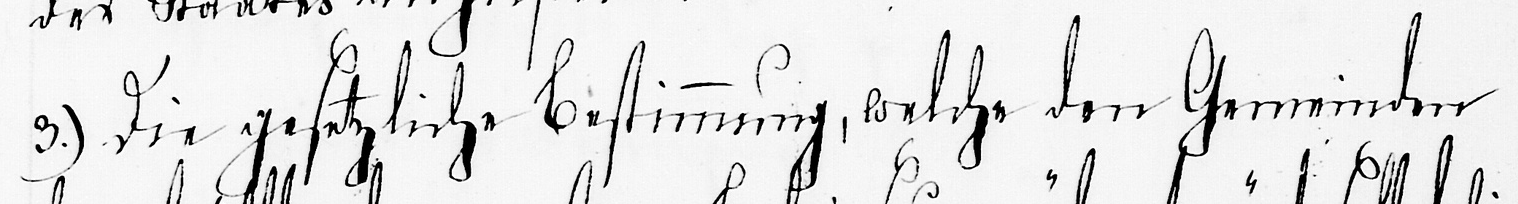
3.) Die gesetzliche Bestimmung, welche den Gemeinden
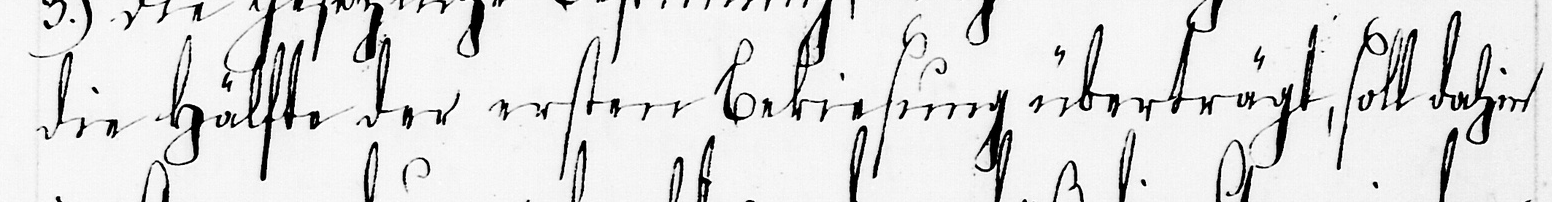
die Hälfte der ersten Bekiesung überträgt, soll dah¬
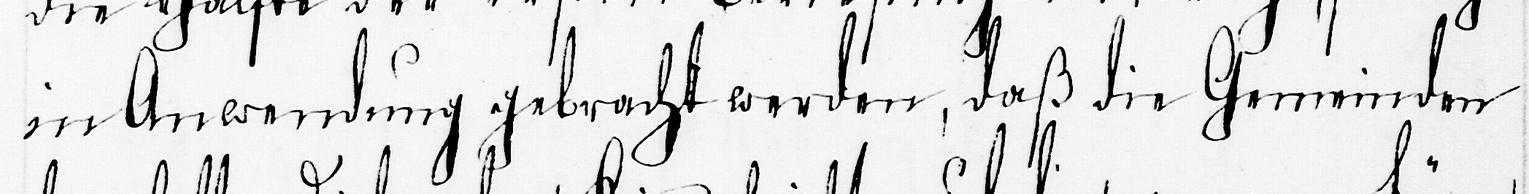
in Anwendung gebracht werden, daß die Gemeinden
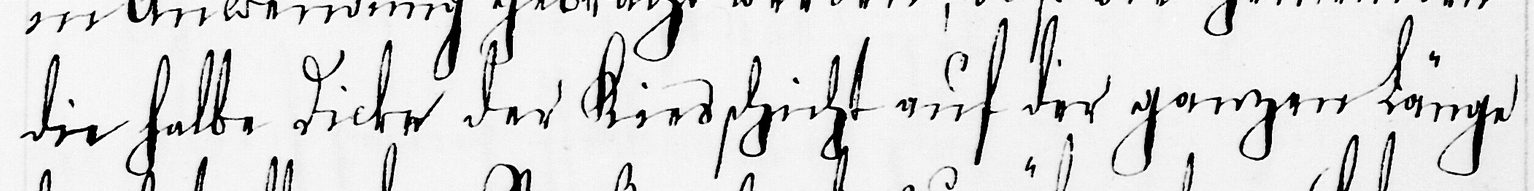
die halbe Dicke der Kiesschicht auf der ganzen Länge
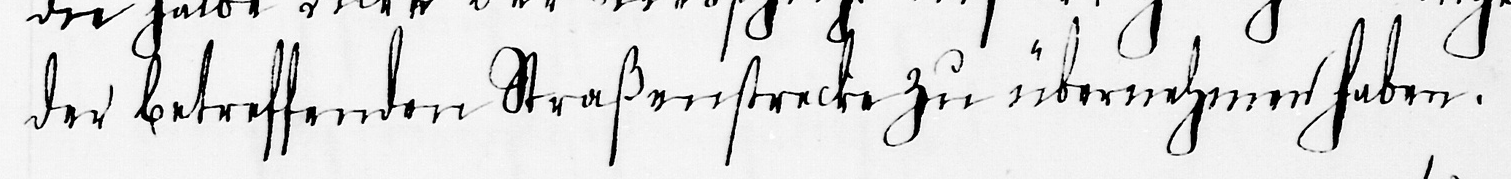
der betreffenden Straßenstrecke zu übernehmen haben.
